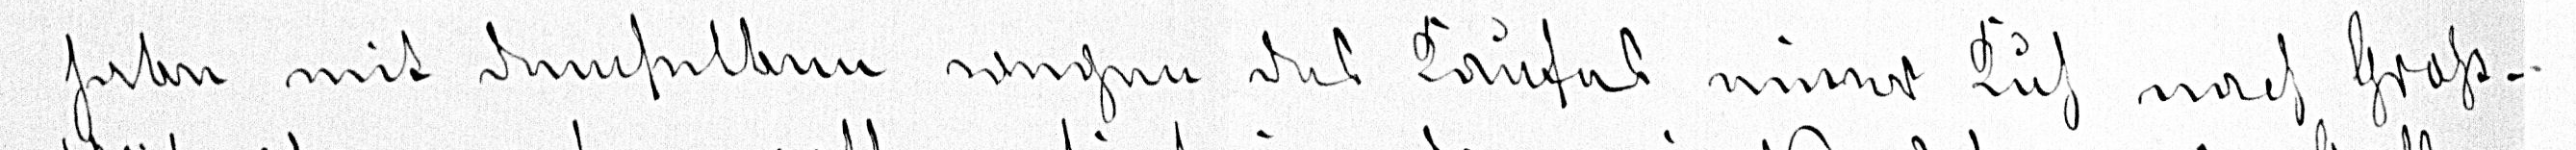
haben mit demselben wegen des Kaufes einer Kuh nach Gross -
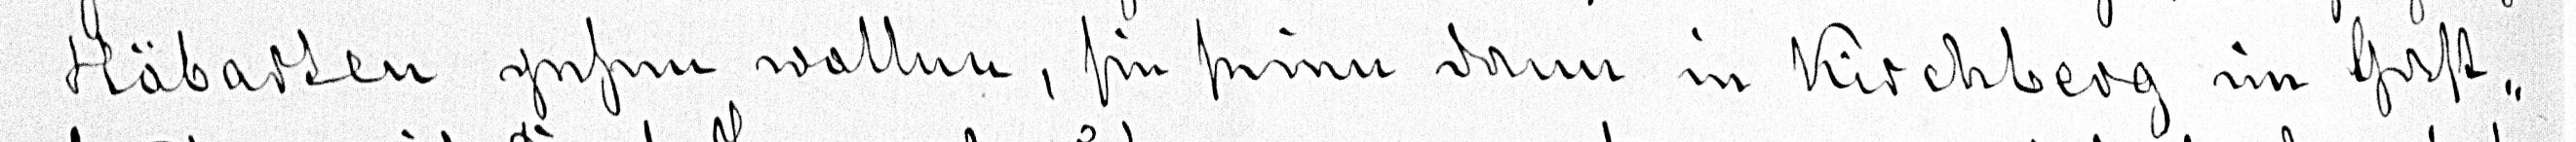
Höbarten gehen wollen, sie seine dann in Kirchberg im Gast¬
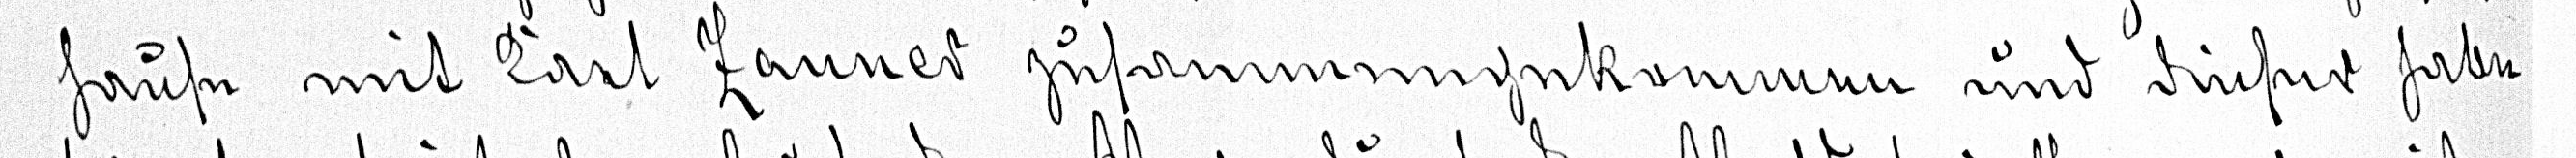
hause mit Karl Zauner zusammengekommen und dieser habe
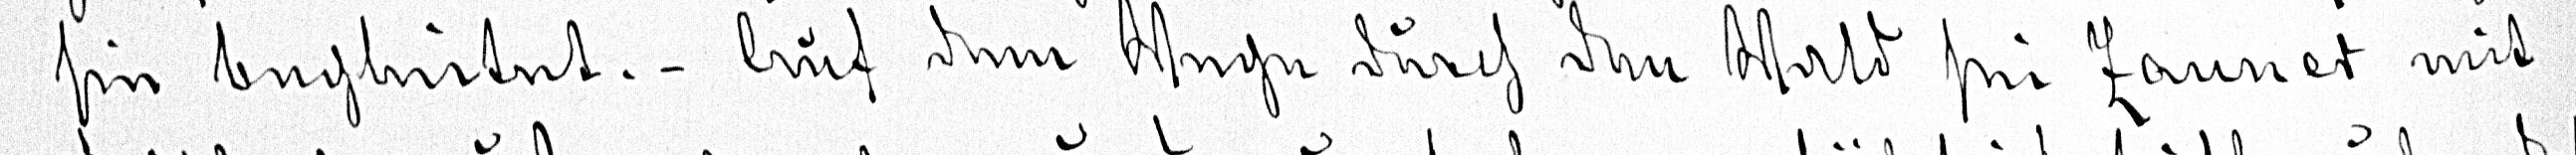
sie begleitet. - Auf dem Wege durch den Wald sei Zauner mit
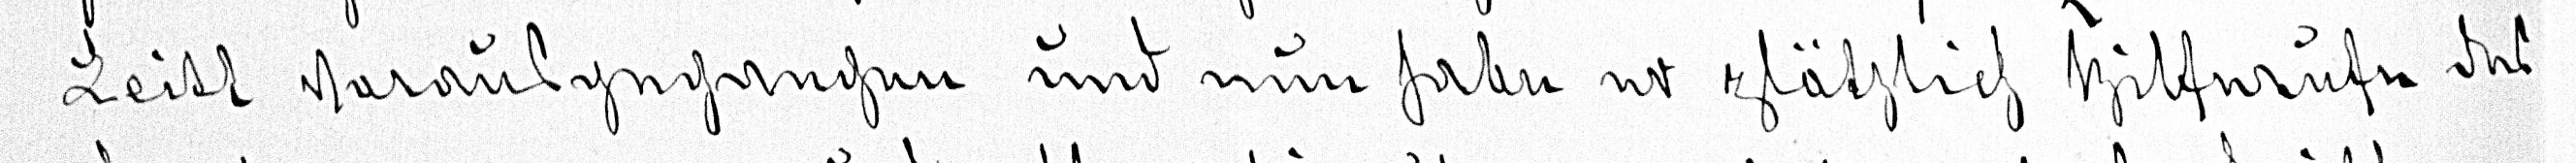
Leitl vorausgegangen und nun habe er plötzlich Hilferufe des
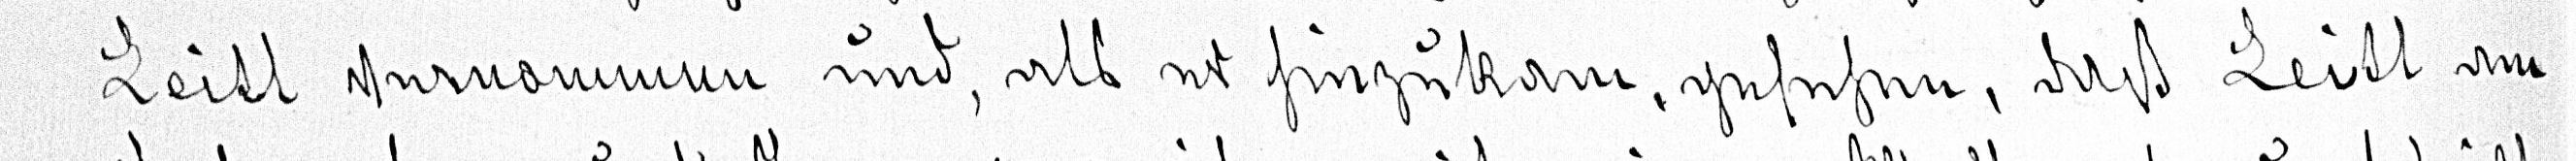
Leitl vernommen und, als er hinzukam, gesehen, daß Leitl am
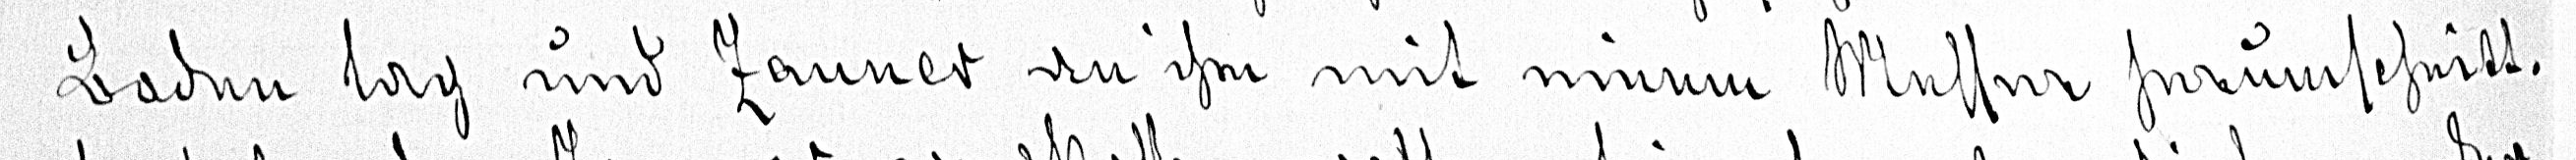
Boden lag und Zauner an ihm mit einem Messer herumscheitt.
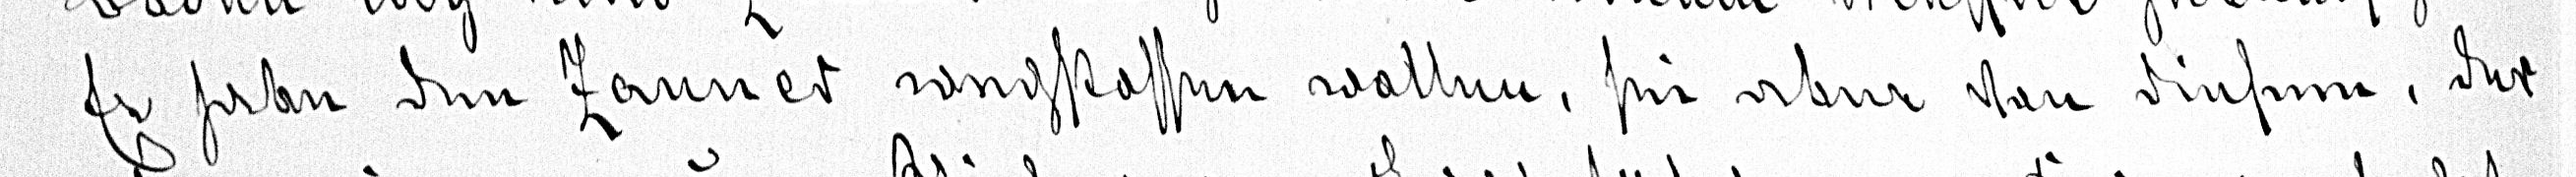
Er habe den Zauner wegstossen wollen, sei aber von diesen, der
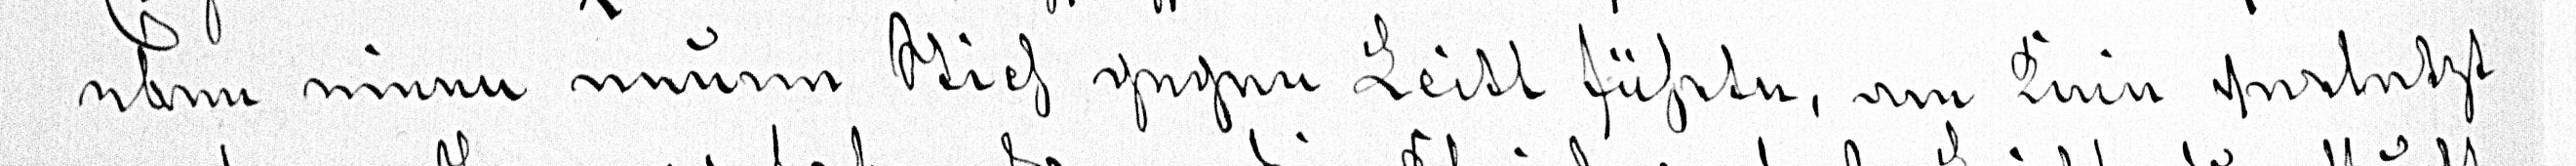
eben einen neune Stich gegen Leitl führte, am Kein verletzt
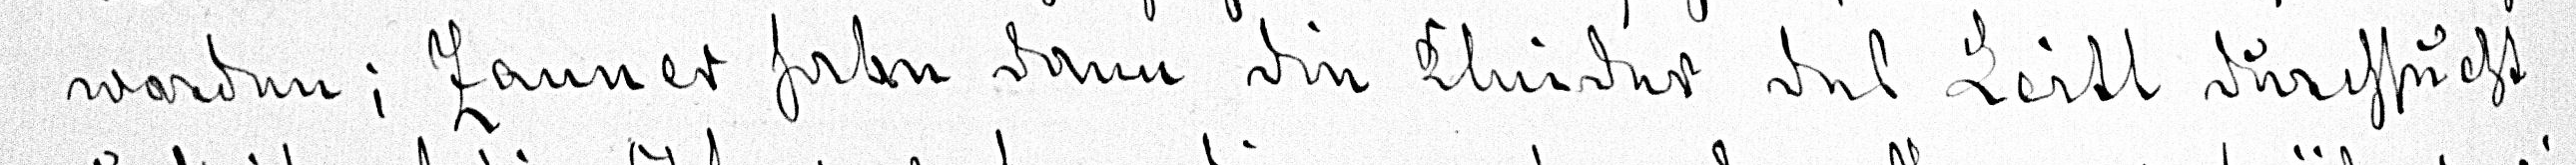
worden; Zauner habe dann die Kleider des Leitl durchsucht
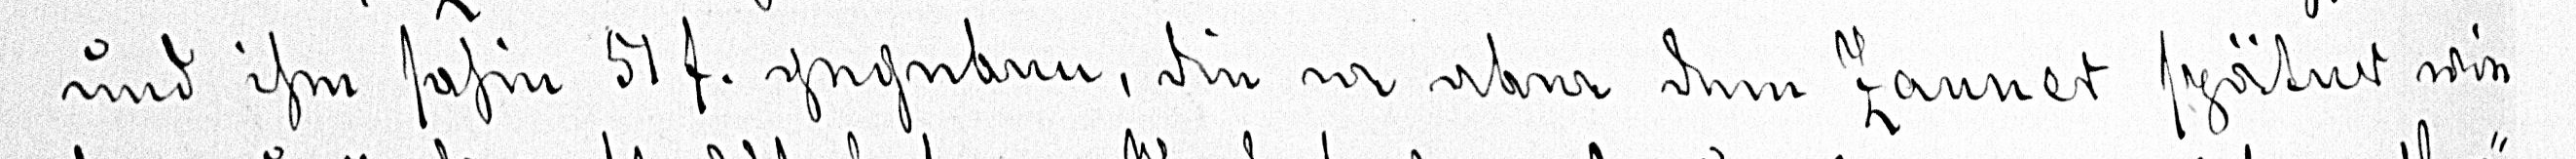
und ihm sohin 51. f. gegeben, die er aber dem Zauner später wie
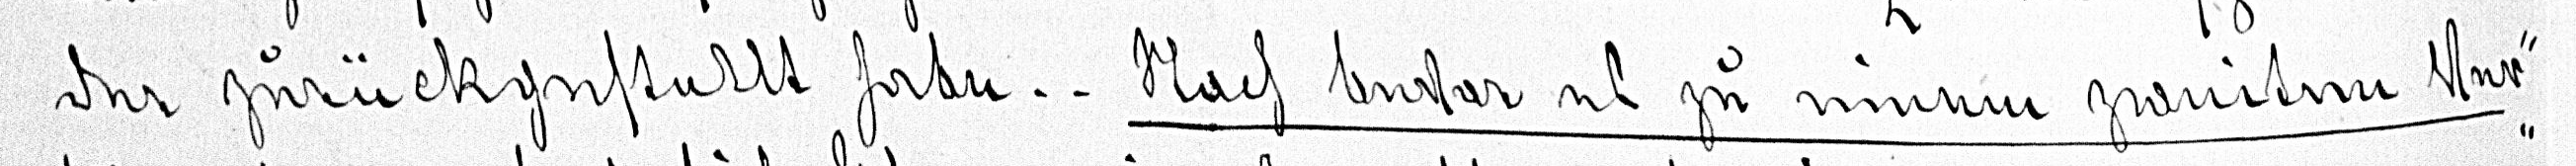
der zurückgestallt habe. - Nach bevor es zu einem zweiten Ver¬
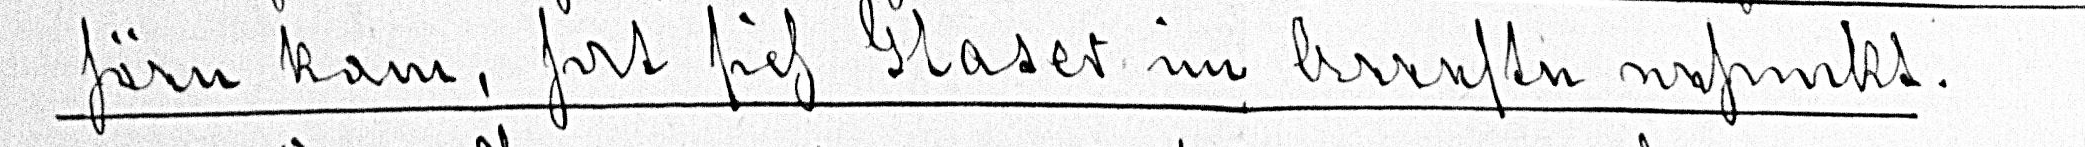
hörn kam, hat sich Glaser im Arreste erhenkt.
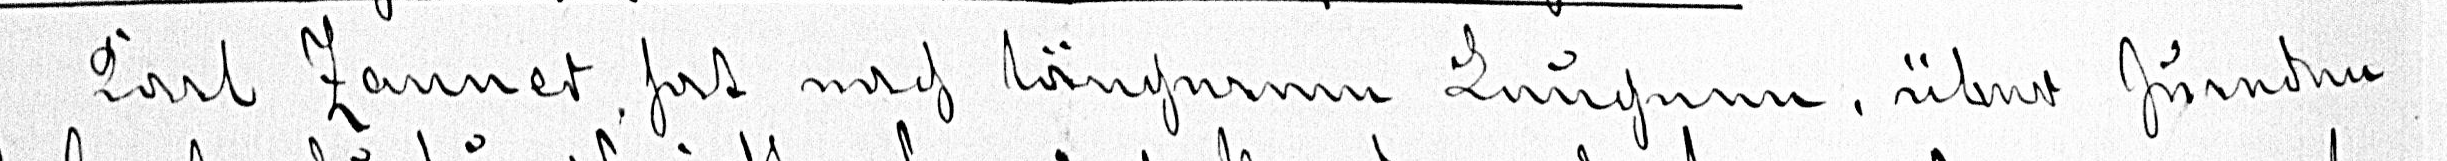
Karl Zauner, hat nach längerem Leugnen, über Zureden
